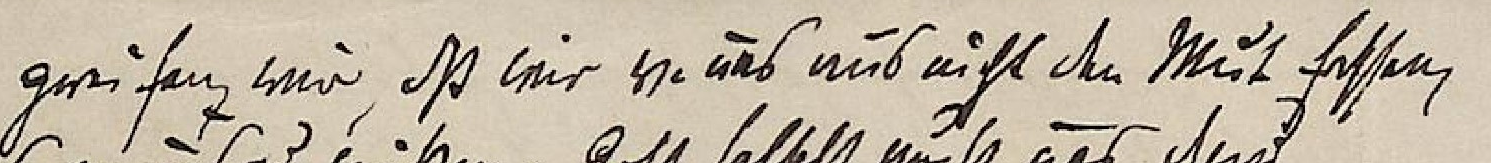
greifen, wir, das wir v. uns aus nicht den Mut fassen,
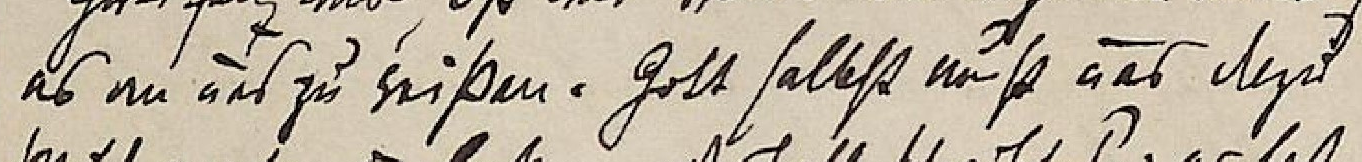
es an uns zu reißen. Gott selbst muß uns dazu
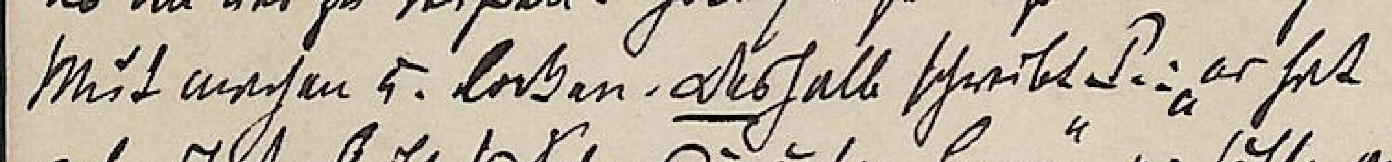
Mut machen u. locken. Deshalb schreibt P.: "er hat
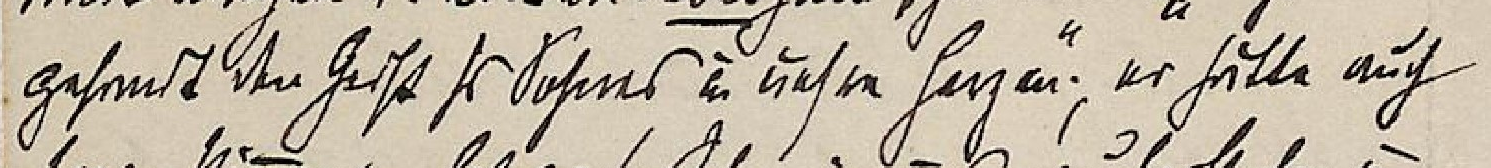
gesandt den Geist s Sohnes in unsere Herzen." er hätte auch
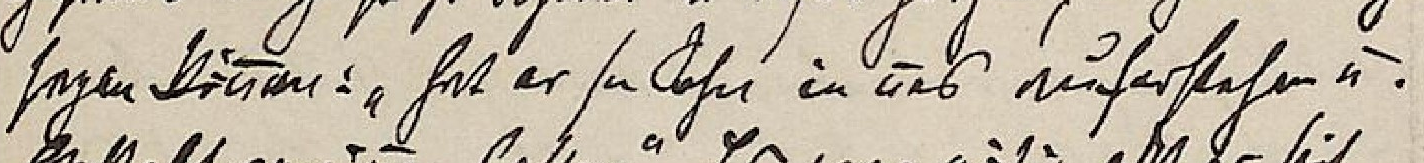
sagen könen: "hat er sn John in uns auferstehen u.
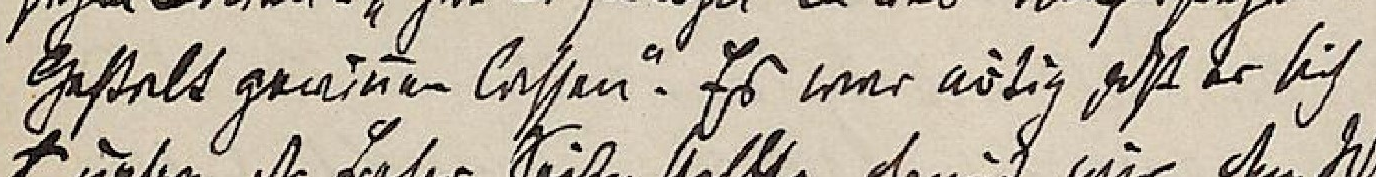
Gestalt gewinen lassen." Es war nötig, daß er sich
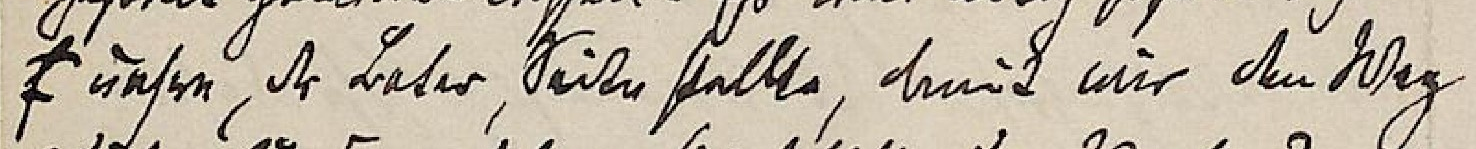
f unsre, dr Beter, Seite stellte, damit wir den Weg
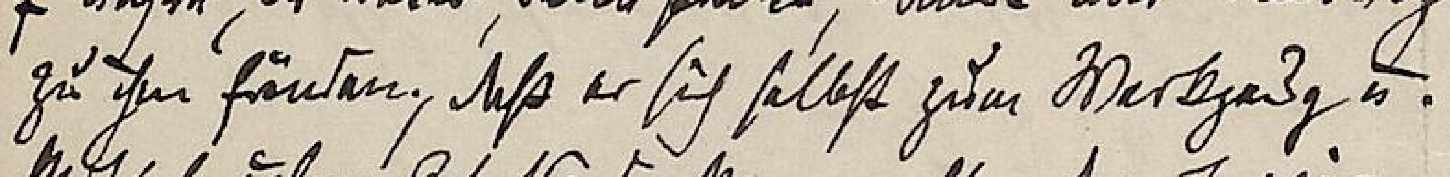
zu ihm fänden, daß er sich selbst zum Werkzeug u.
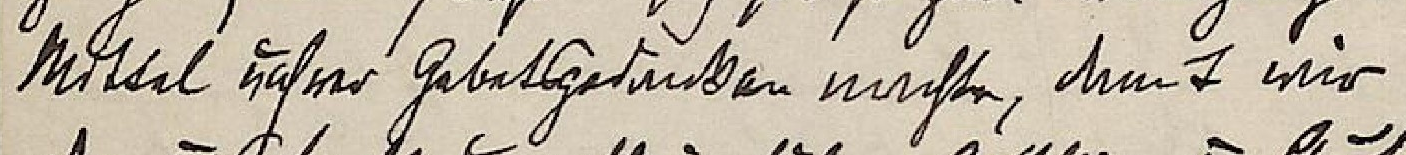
Mittel unsrer Gebetsgedanken machte, damit wir
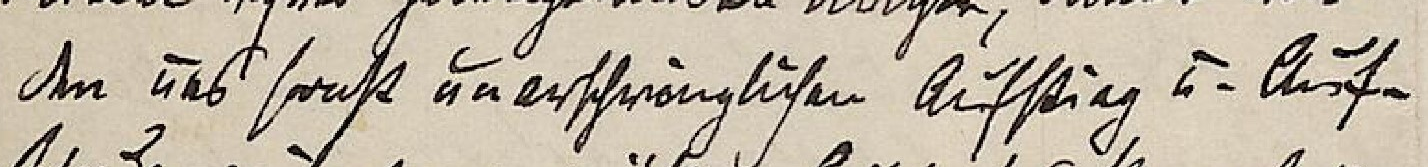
den uns sonst unerschwänglichen Aufstieg u. Auf¬
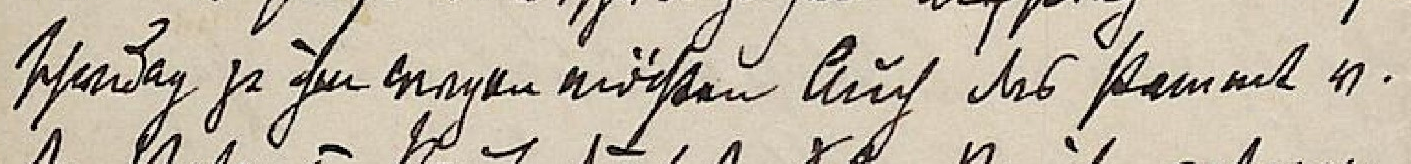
schwung zu ihm wagen möchten. Auch das stammt v.
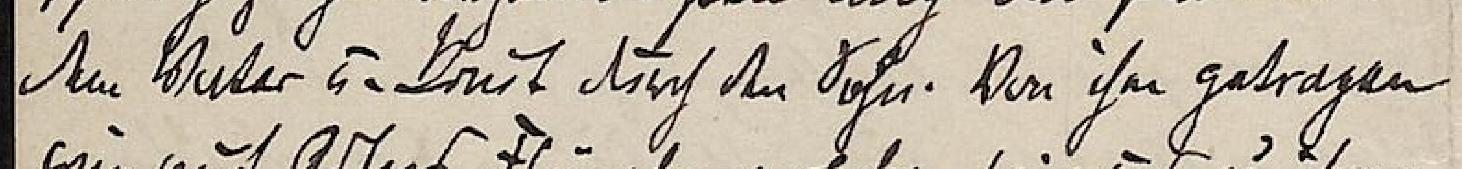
dem Vater u. komt durch den Sohn. Von ihm getragen
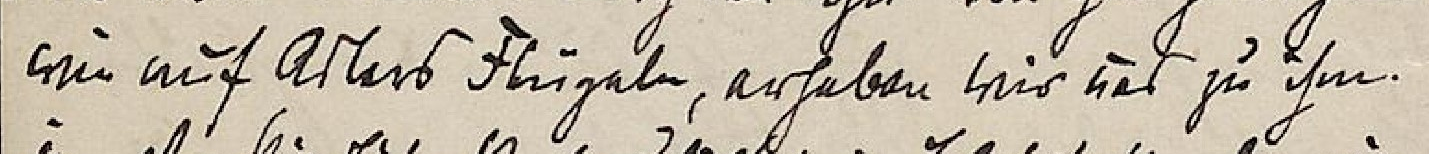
wie mit Adlers Flügeln, erheben wir uns zu ihm.
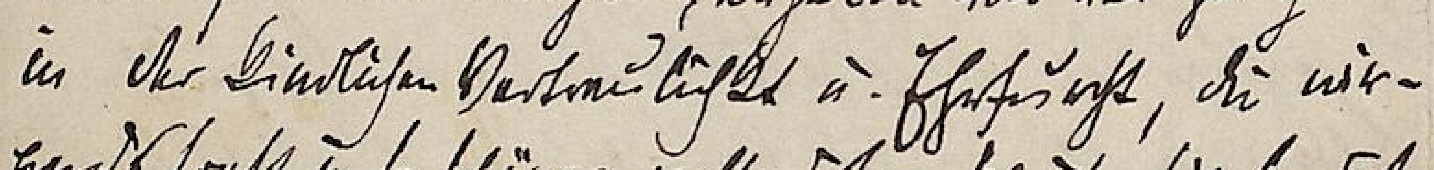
in der kindliche Vertraulichkt. u. Ehrfurcht, die nir¬
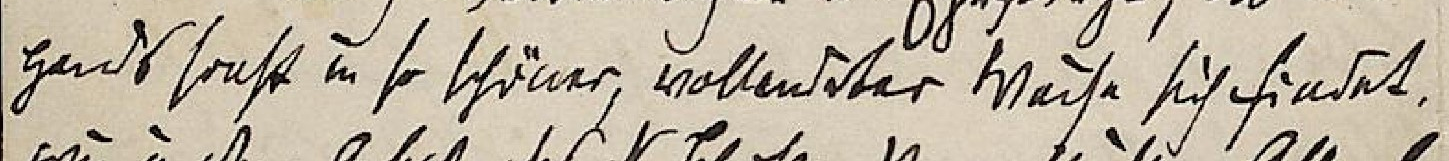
gends sonst in so schöner, vollendeter Weise sich findet,
